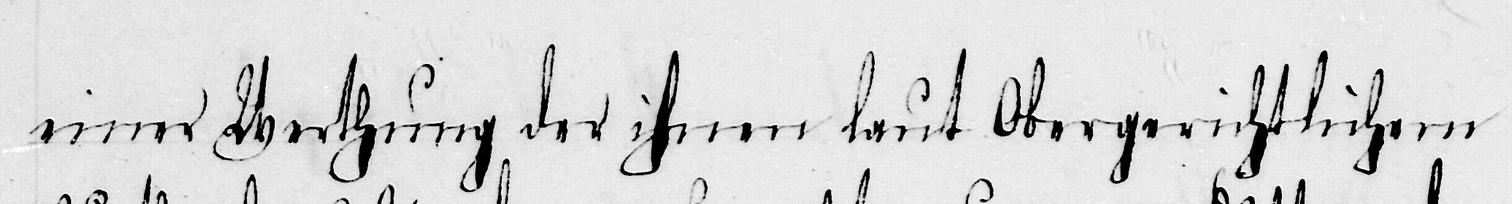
einer Werthung der ihnen laut Obergerichtlichem
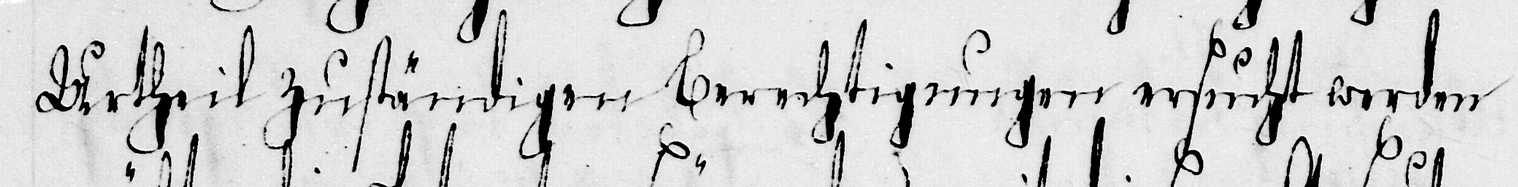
Urtheil zuständigen Berechtigungen ersucht werden
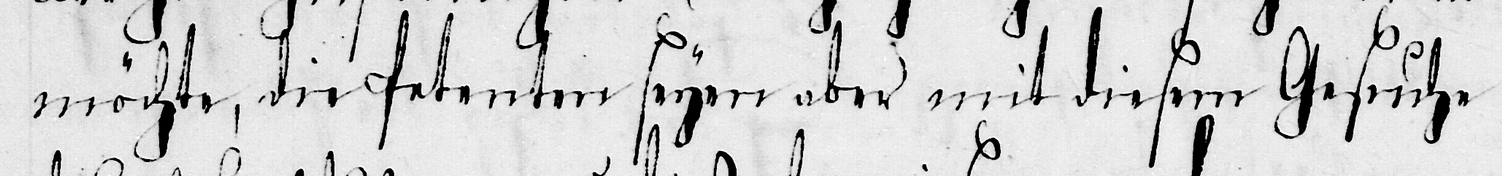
möchte, die Petenten seyen aber mit diesem Gesuche
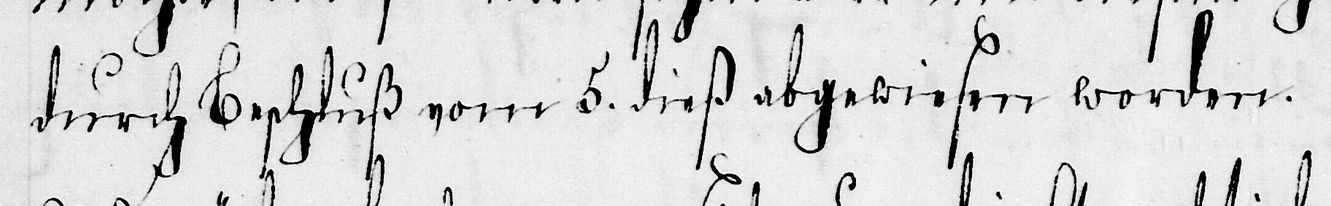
durch Beschluß vom 5. dieß abgewiesen worden.
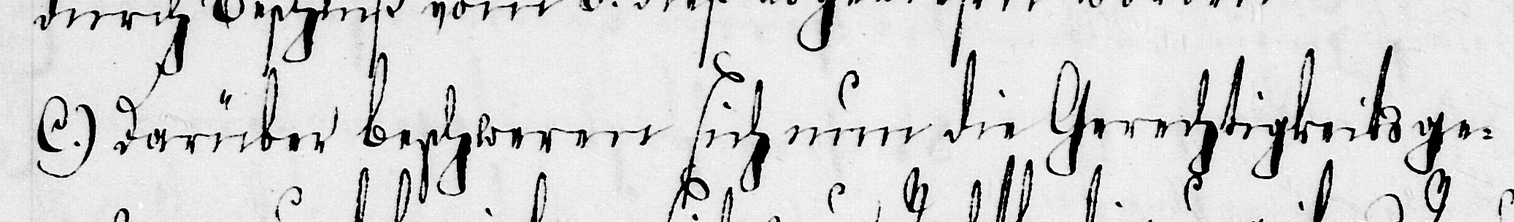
C.) Darüber beschweren sich nun die Gerechtigkeitsge¬
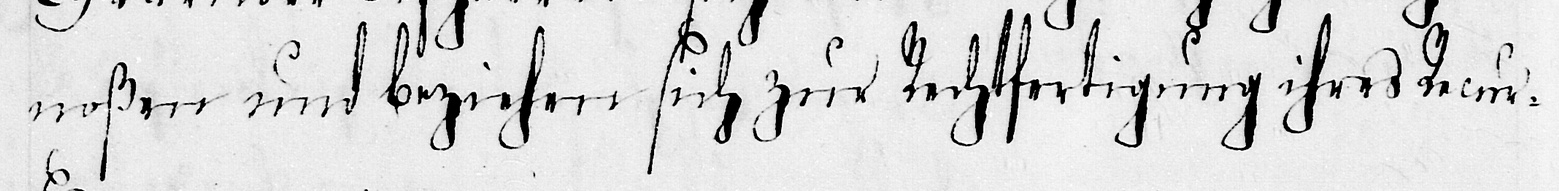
noßen und beziehen sich zur Rechtfertigung ihres Recur¬
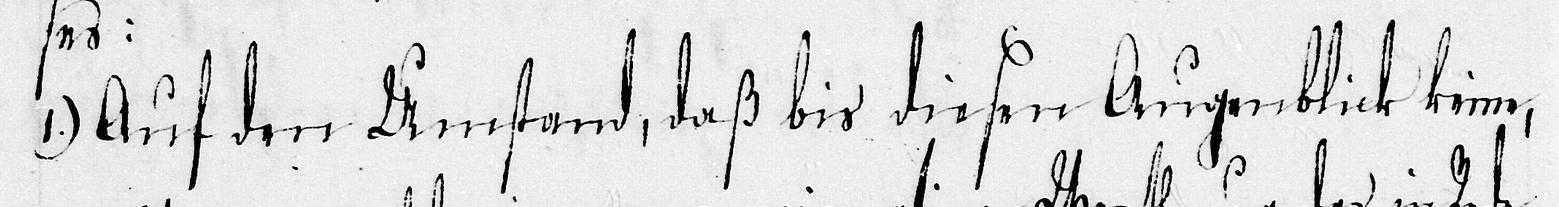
1.) Auf den Umstand, daß bis diesen Augenblick kein¬
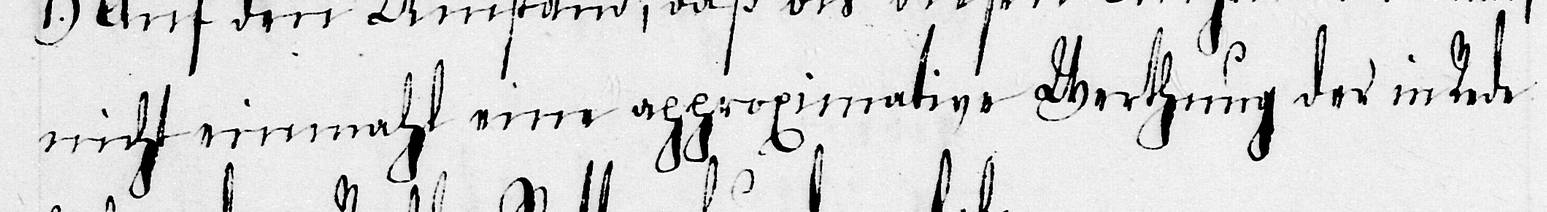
nicht einmahl eine approximative Werthung der in Rede
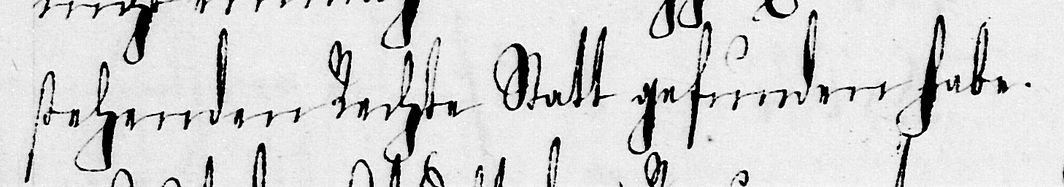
stehenden Rechte Statt gefunden habe.
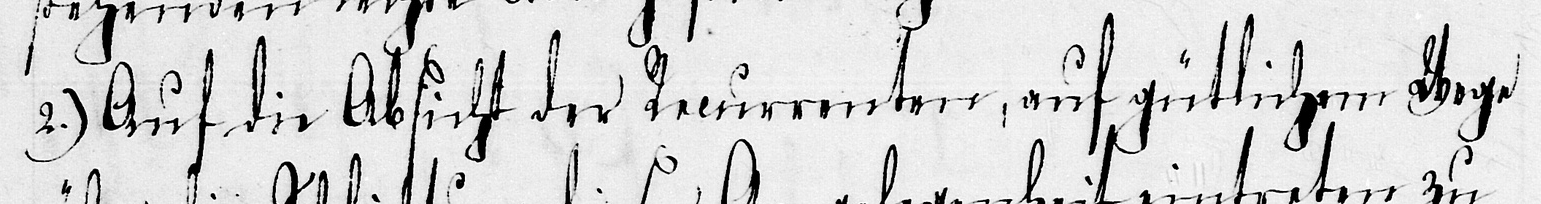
2.) Auf die Absicht der Recurrenten, auf gütlichem Wege
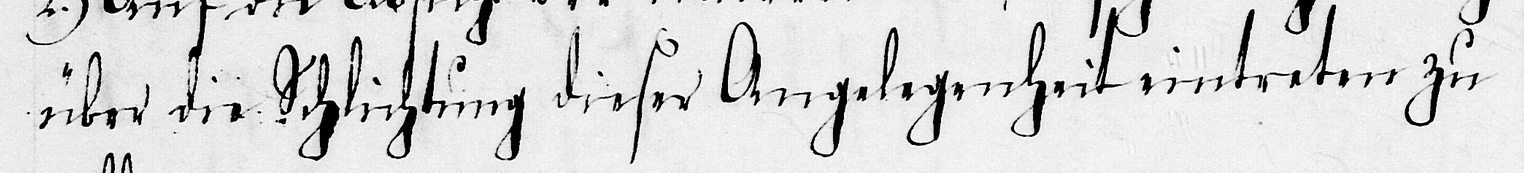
über die Schlichtung dieser Angelegenheit eintreten zu
